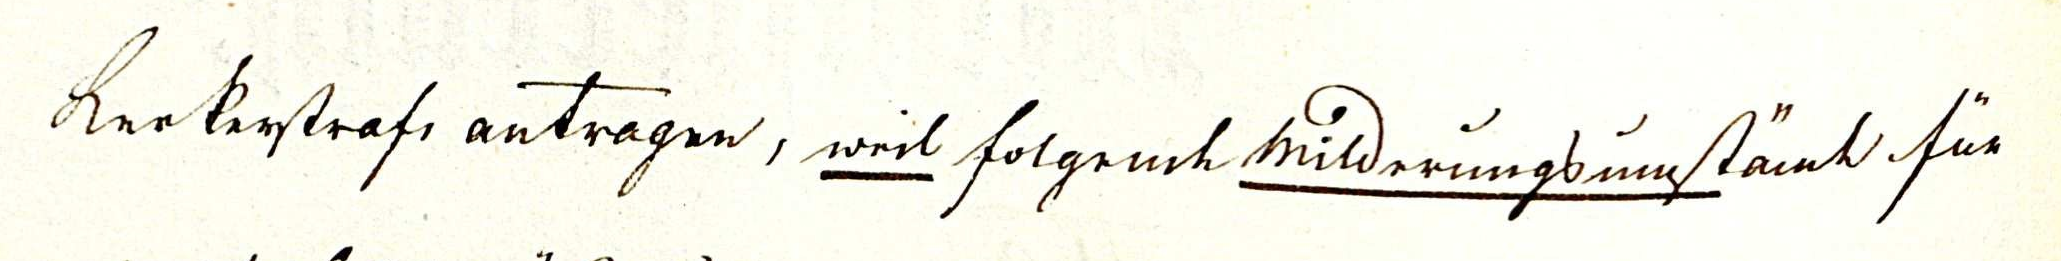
Kerkerstrafe antragen, weil folgende Milderungsumstände für
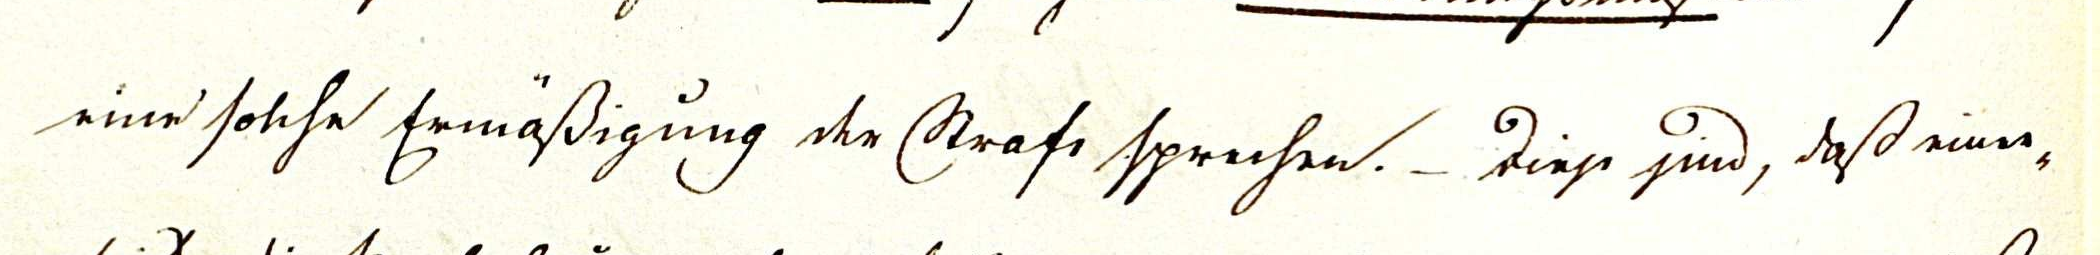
eine solche Ermäßigung der Strafe sprechen. Diese sind, daß einer¬
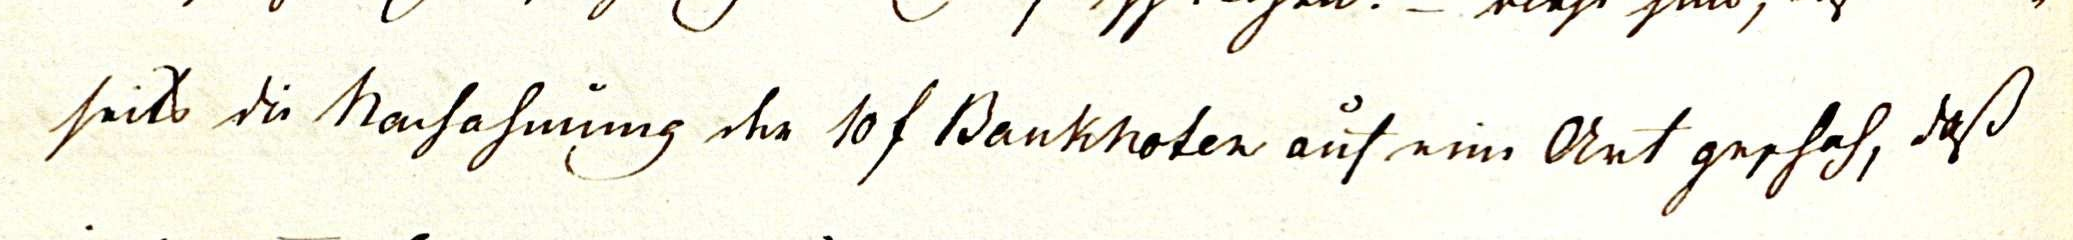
seits die Nachahmung der 10f Banknoten auf eine Art geschah, daß
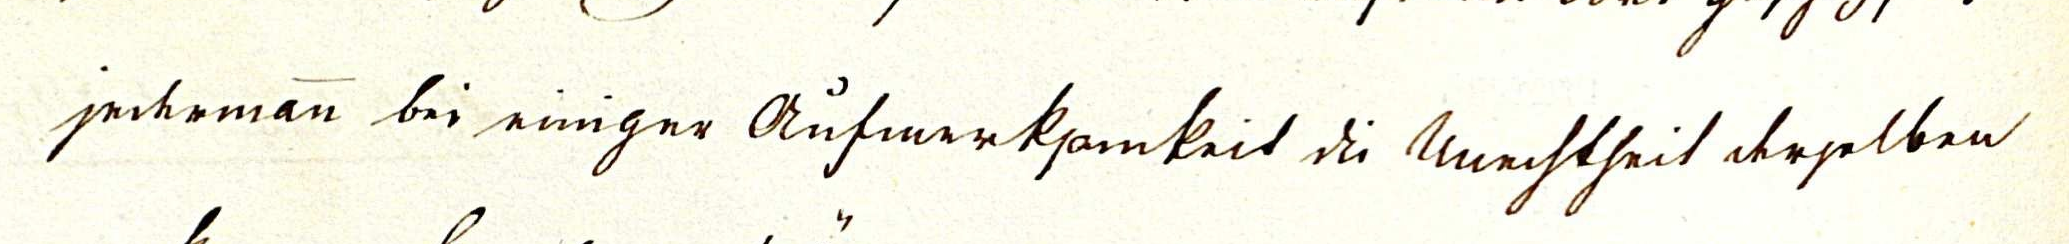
jedermann bei einiger Aufmerksamkeit die Unrechtheit derselben
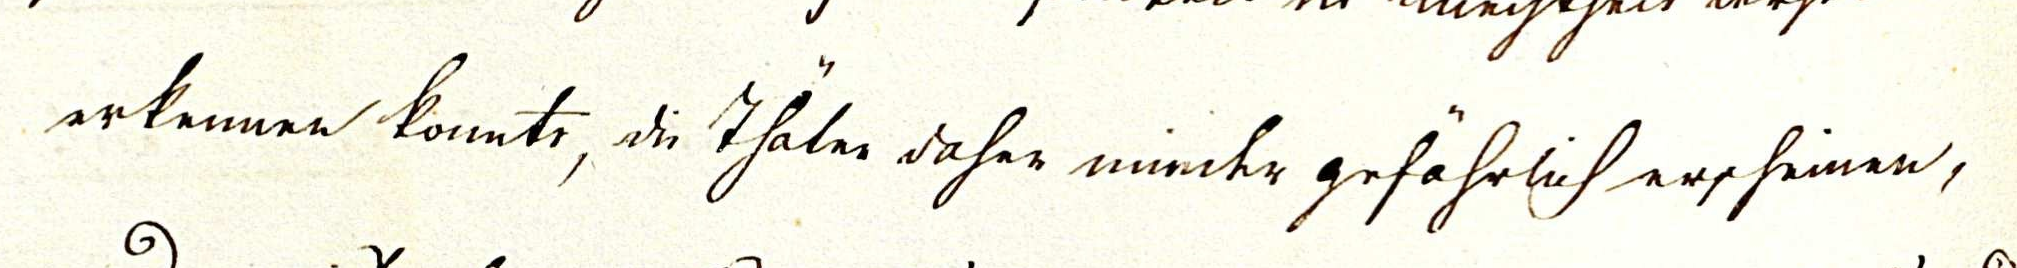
erkennen konnte, die Thäter daher minder gefährlich erscheinen,
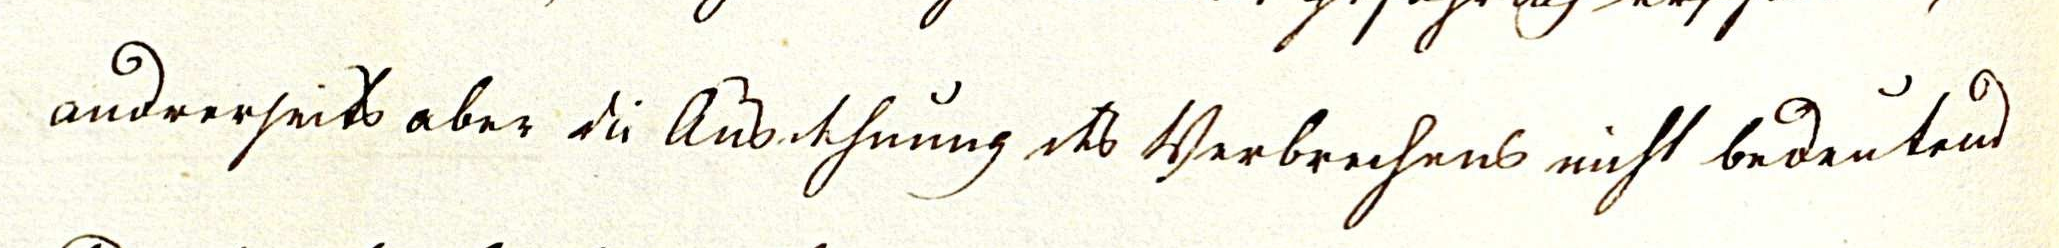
andrerseits aber die Ausdehnung des Verbrechens nicht bedeutend
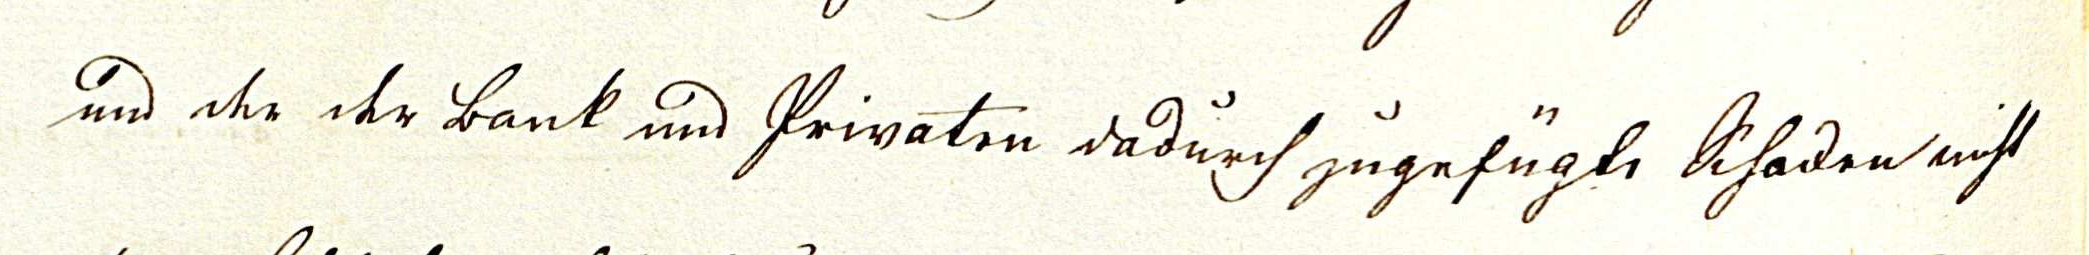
und die der Bank und Privaten dadurch zugefügte Schaden nicht
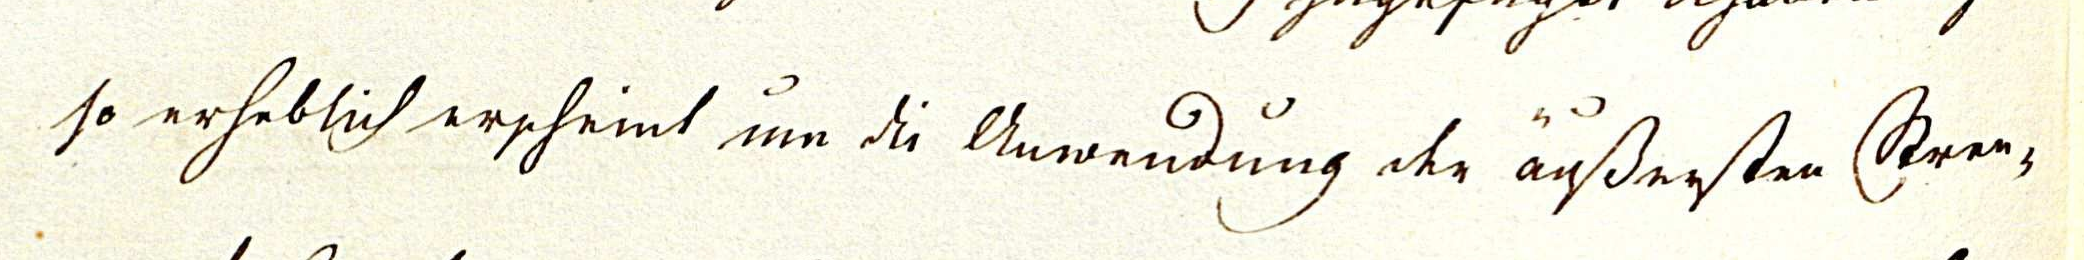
so erheblich erscheint um die Anwendung den äußersten Stren¬
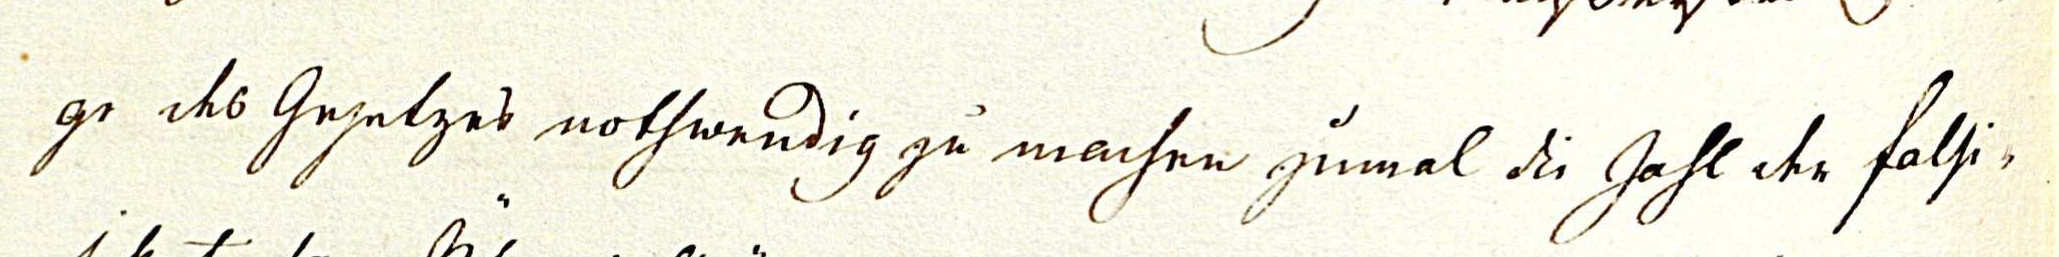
ge des Gesetzes nothwendig zu machen zumal die Zahl der Falsi¬
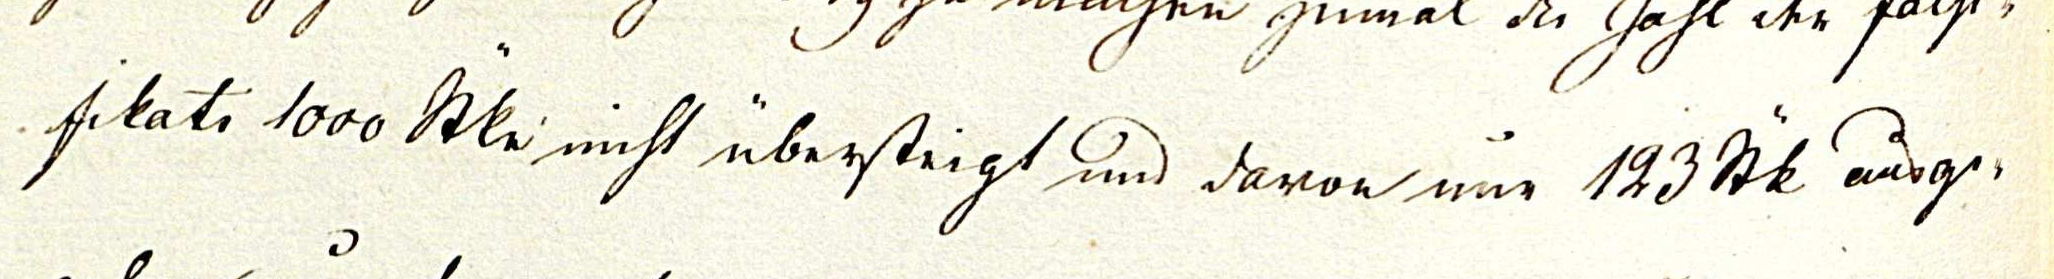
fikate 1000 Stke nicht übersteigt und davon nur 123 Stk ausge¬
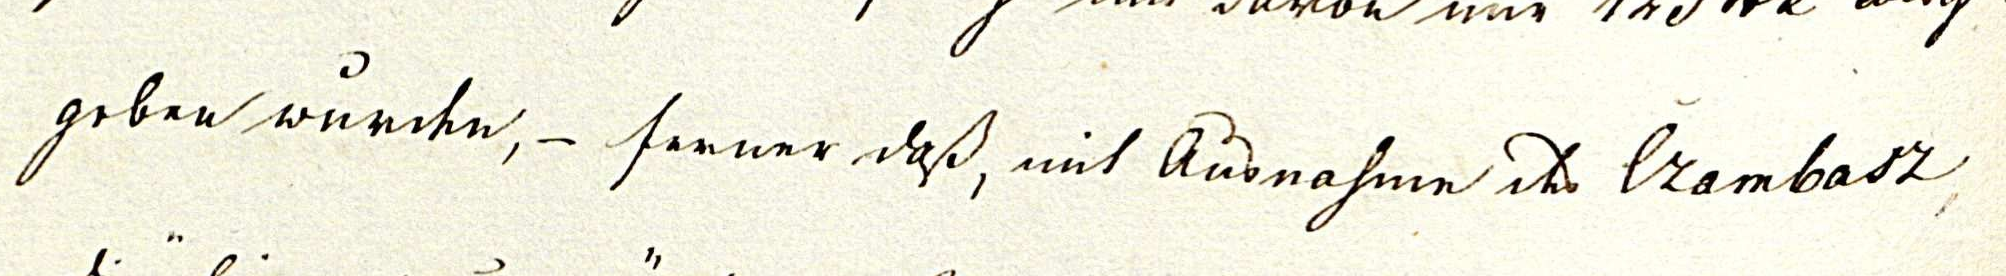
geben wurden, -- ferner daß, mit Ausnahme des Czambasz
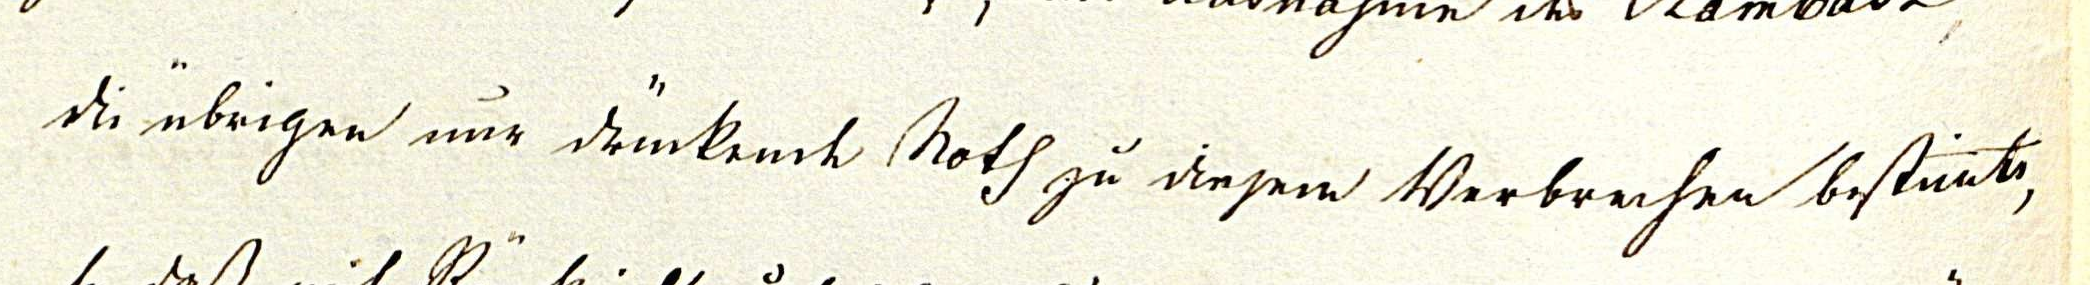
die übrigen nur drückende Noth zu diesem Verbrechen bestimmte
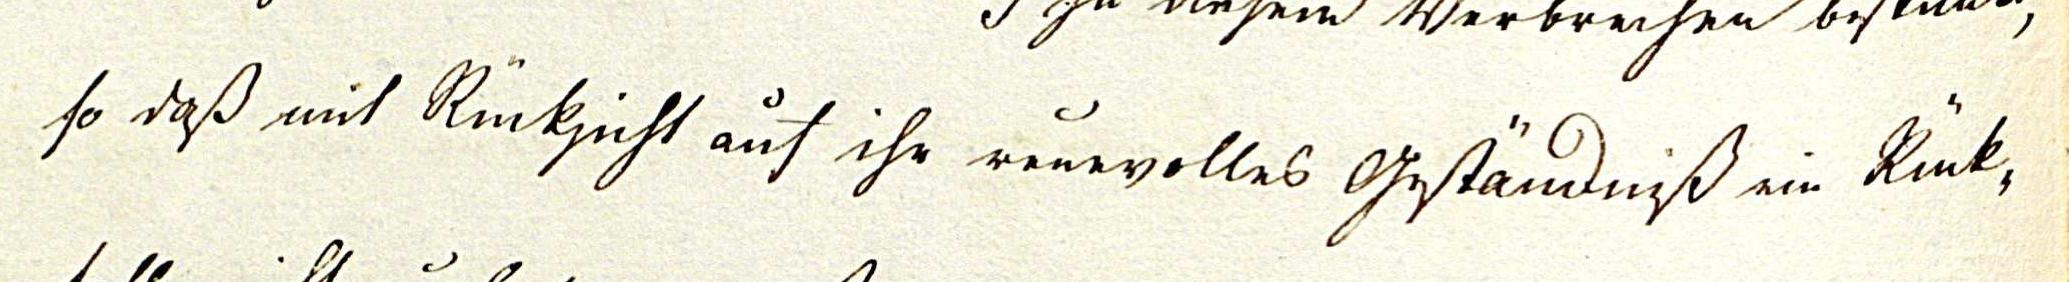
so daß mit Rücksicht auf ihr reuevolles Geständniß ein Rück¬
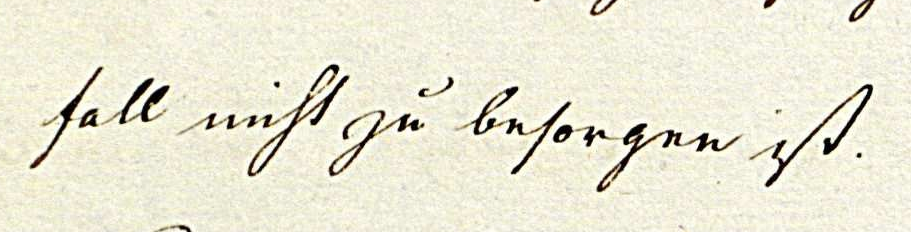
fall nicht zu besorgen ist.
